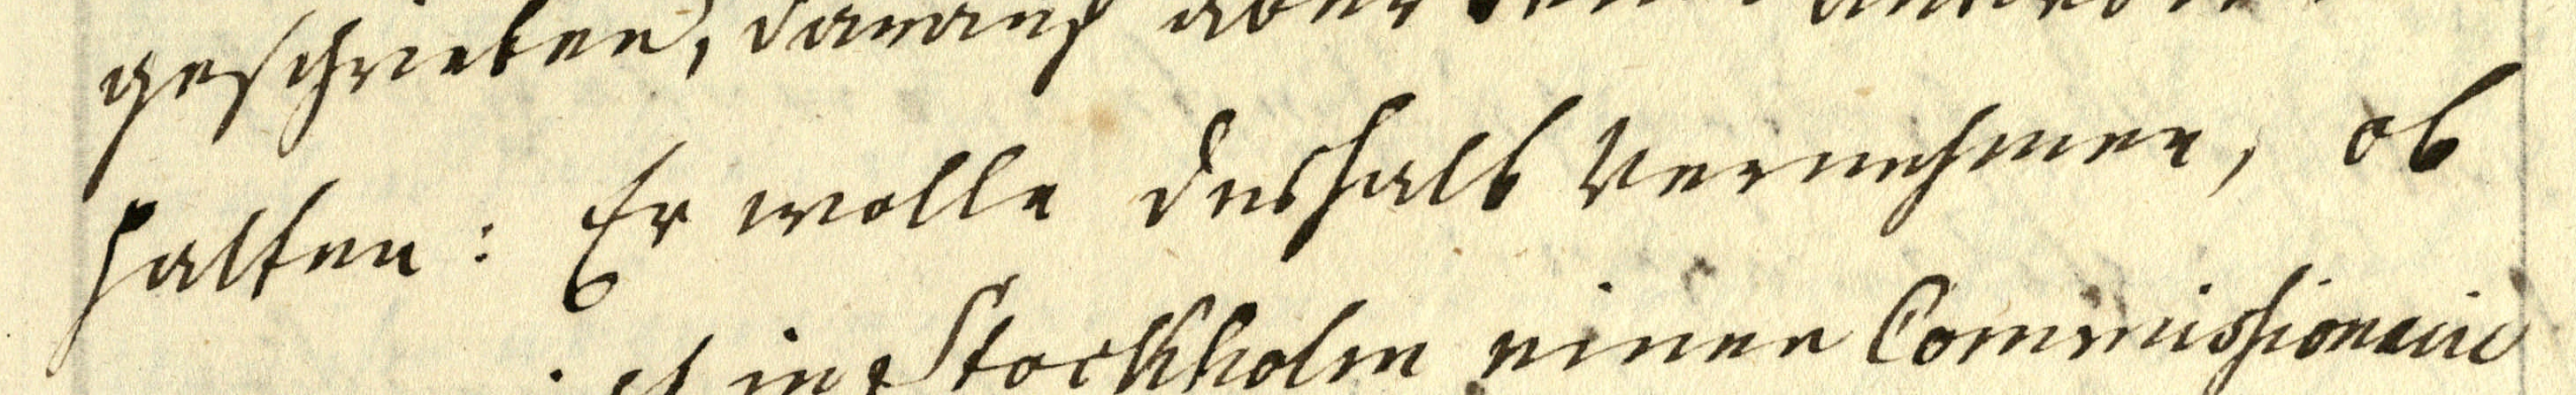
halten. Er wolle deshalb vernehmen, ob
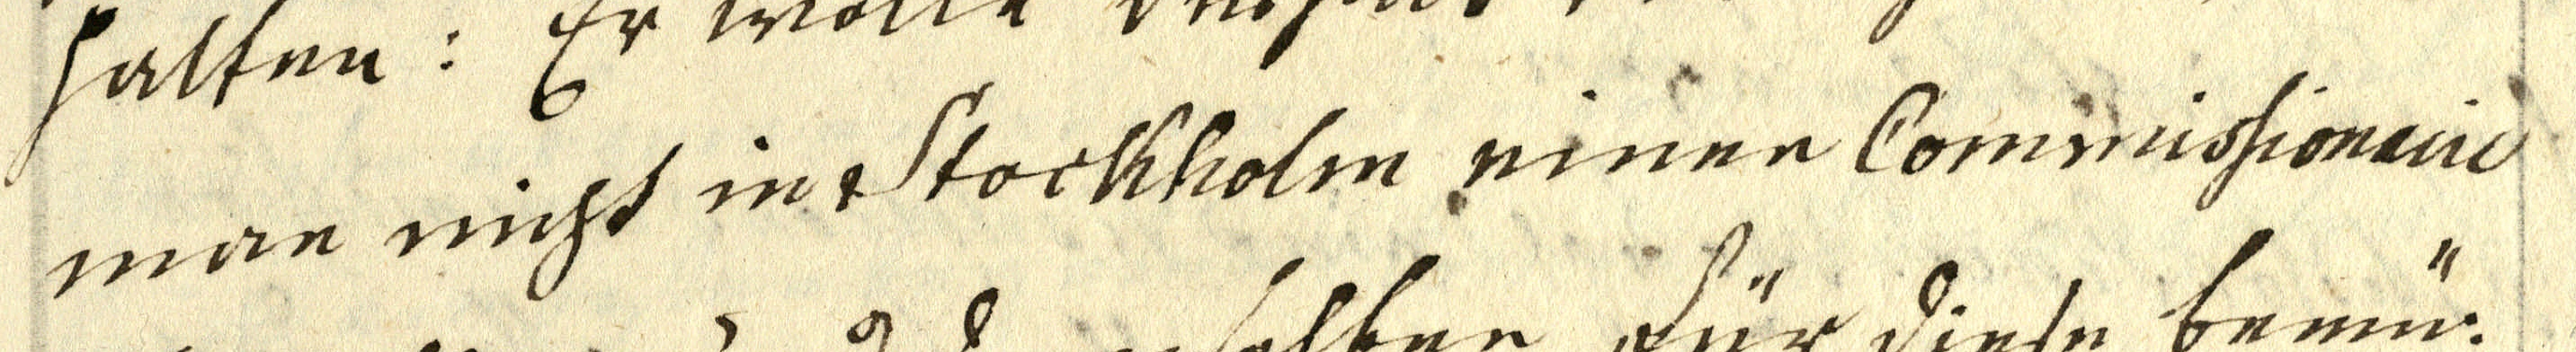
man nicht in Stockholm einen Commissionaire
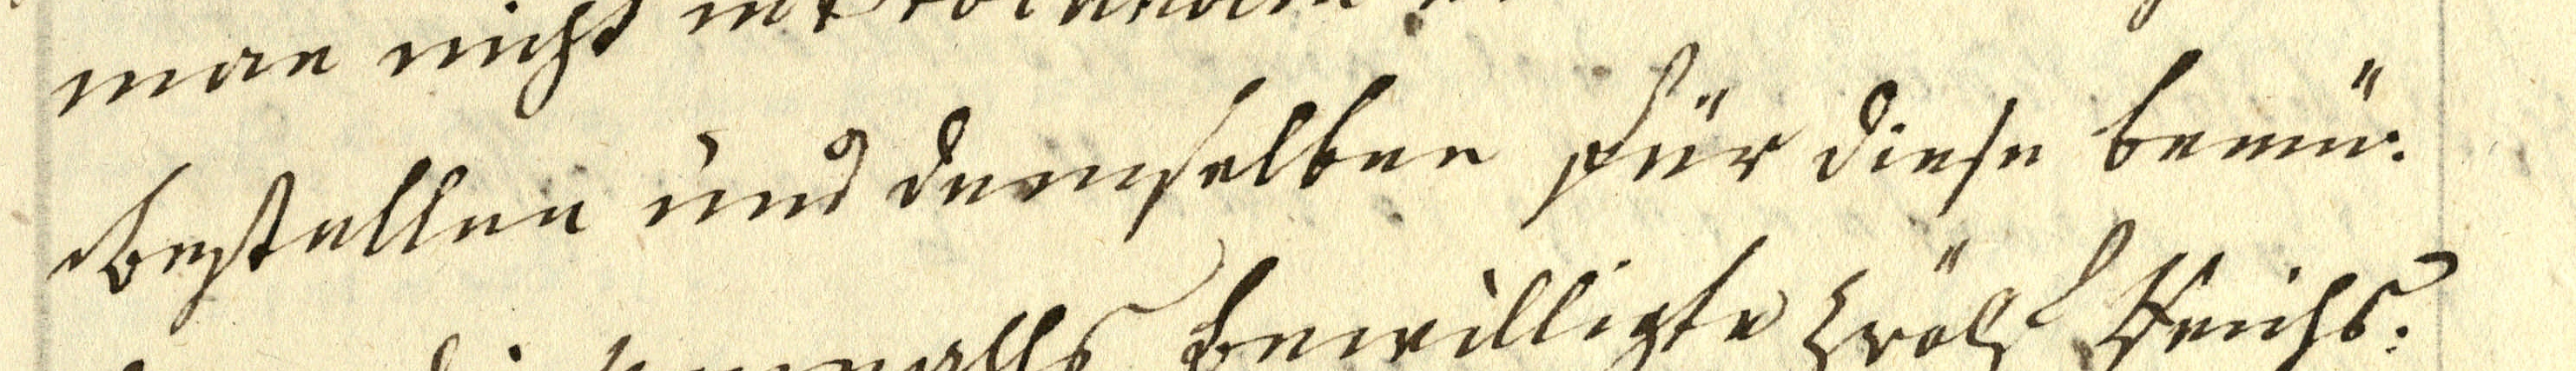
bestellen und demselben für diese Bemü¬
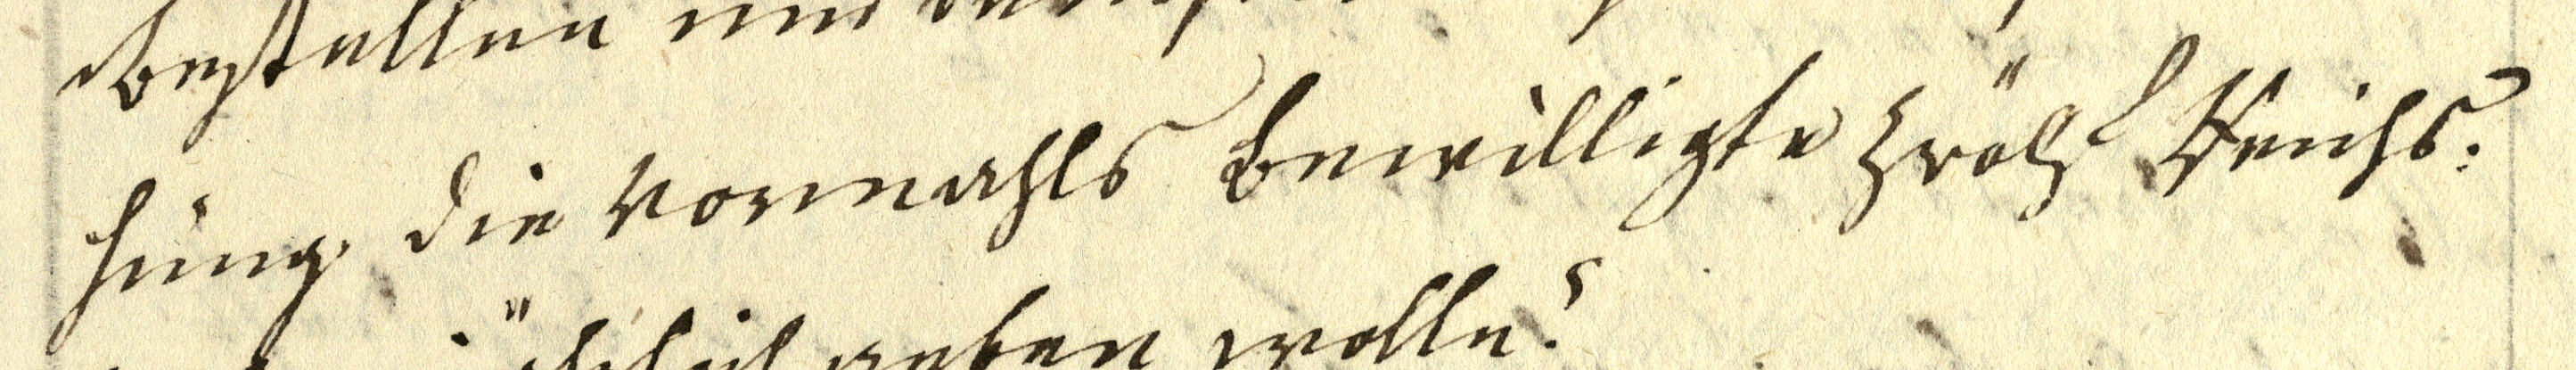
hung die vormahls bewilligte zwölf Reichs¬
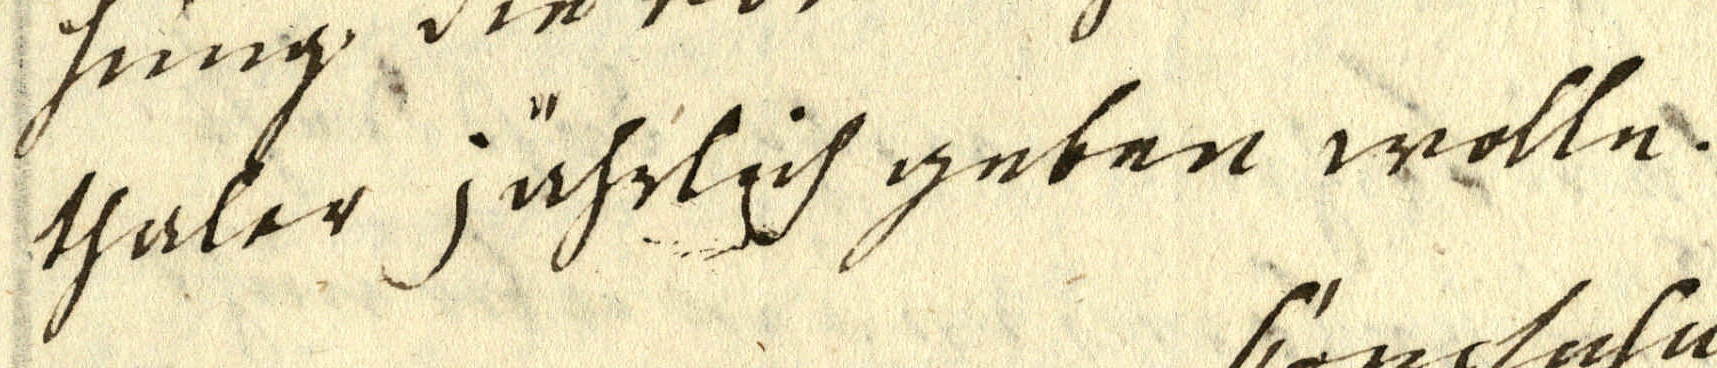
thaler jährlich geben wolle?
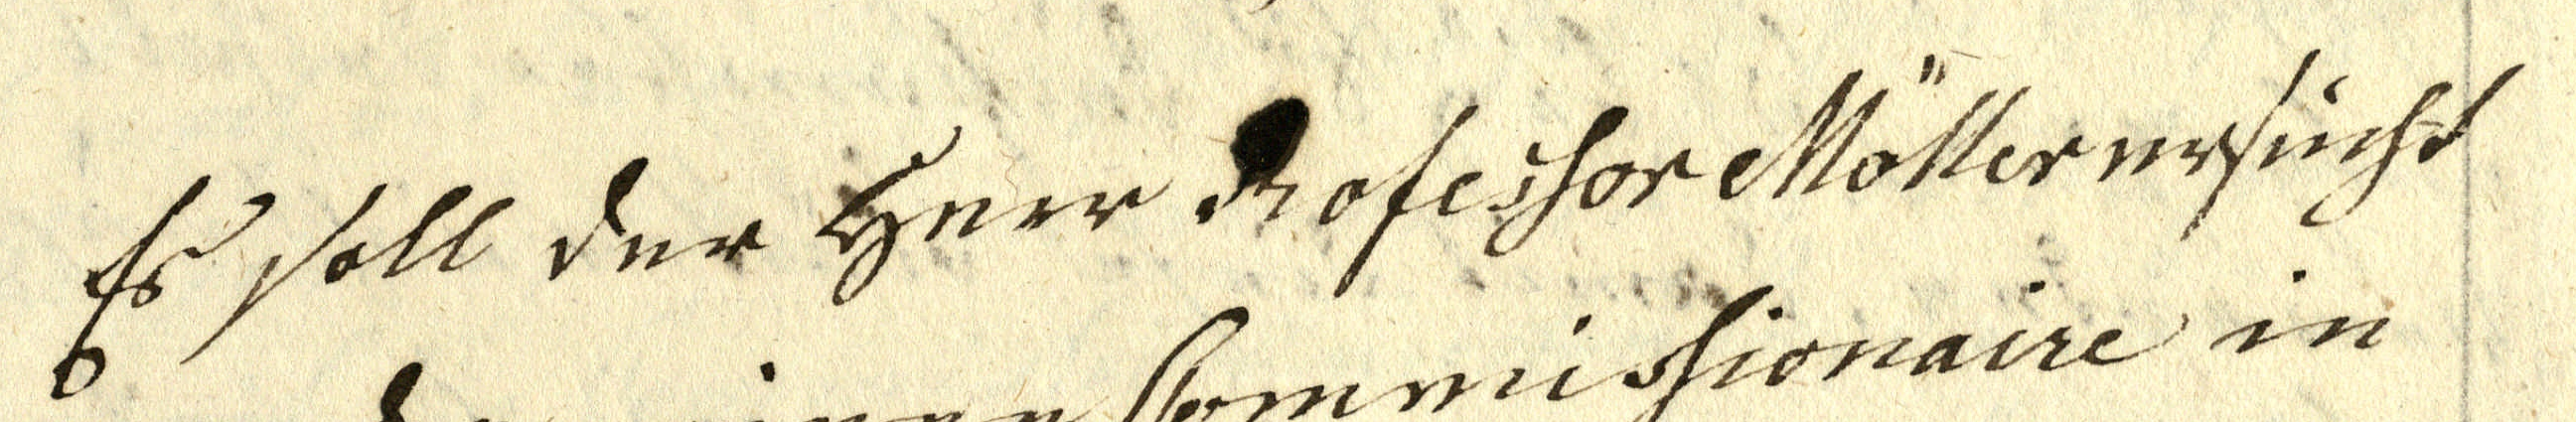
Er soll der Herr Professor Möller ersucht
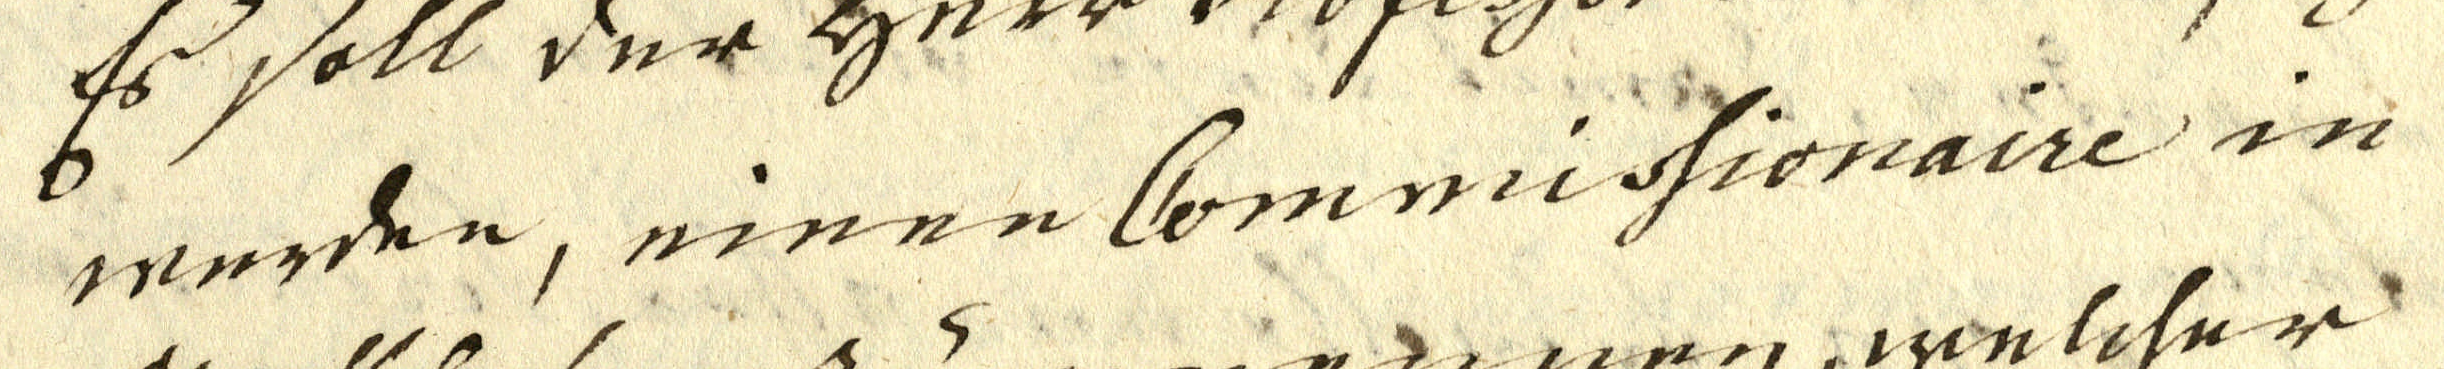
werden, einen Commissionaire in
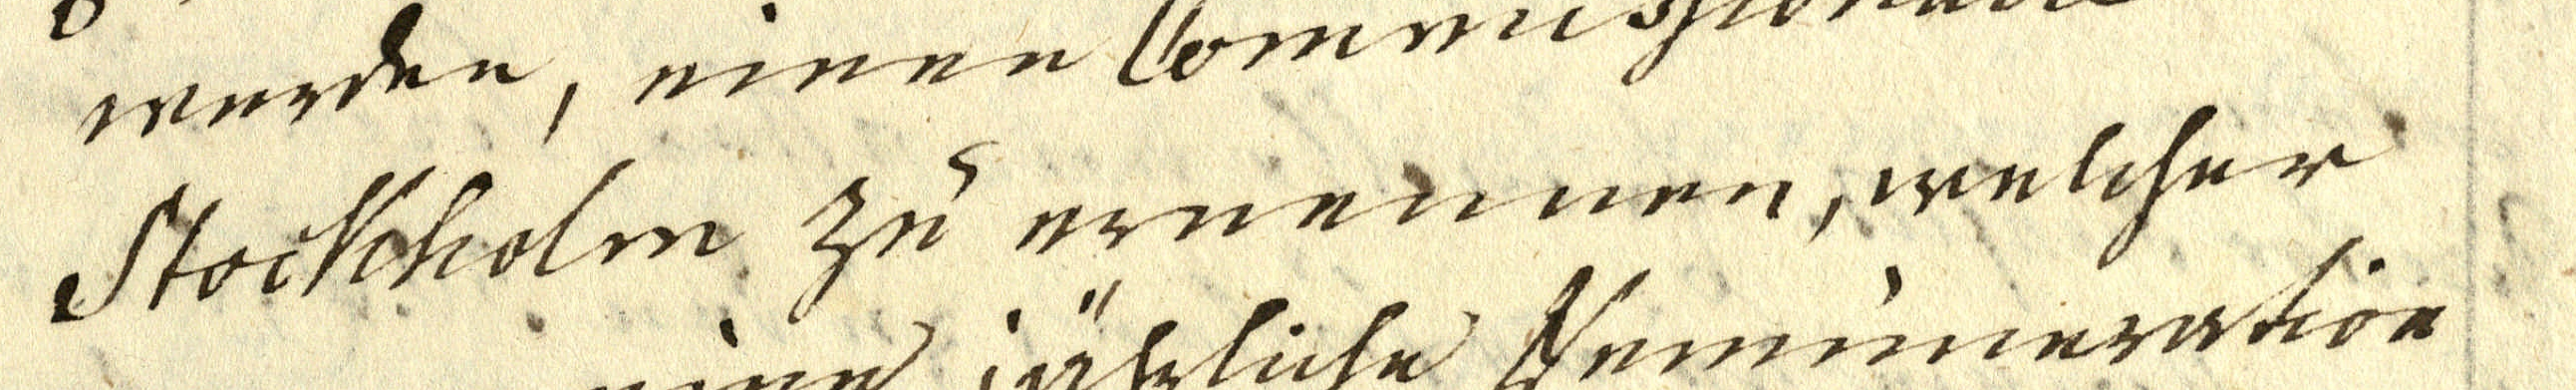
Stockholm zu ernennen, welcher
